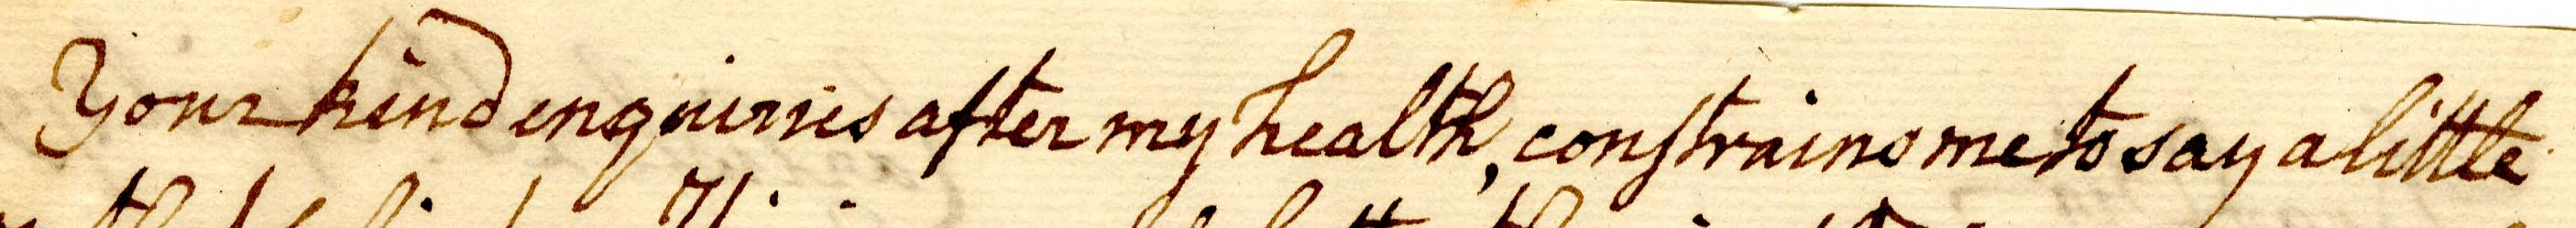Your kind enquiries after my health, constrains me to say a little
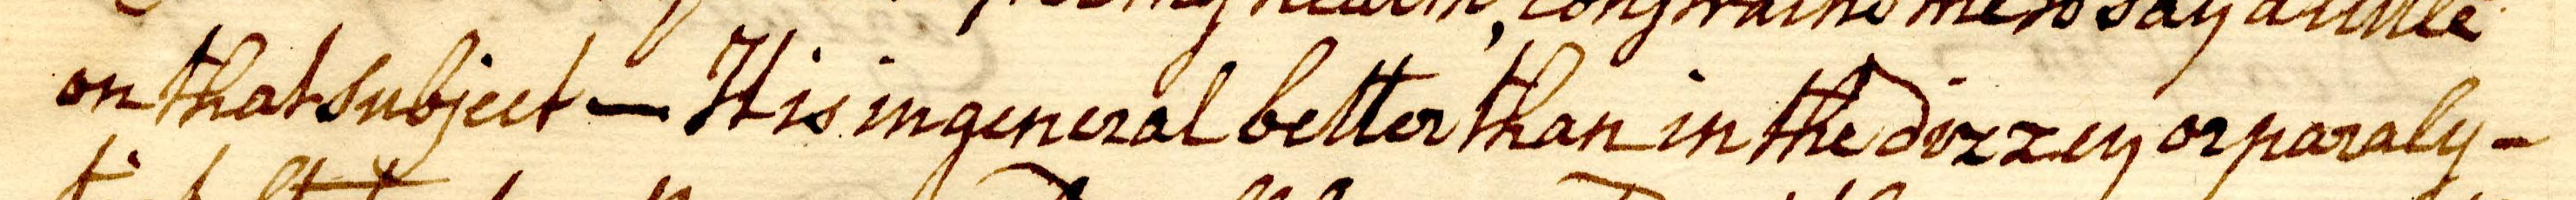on that subject- It is in general better than in the dizzy or paraly-
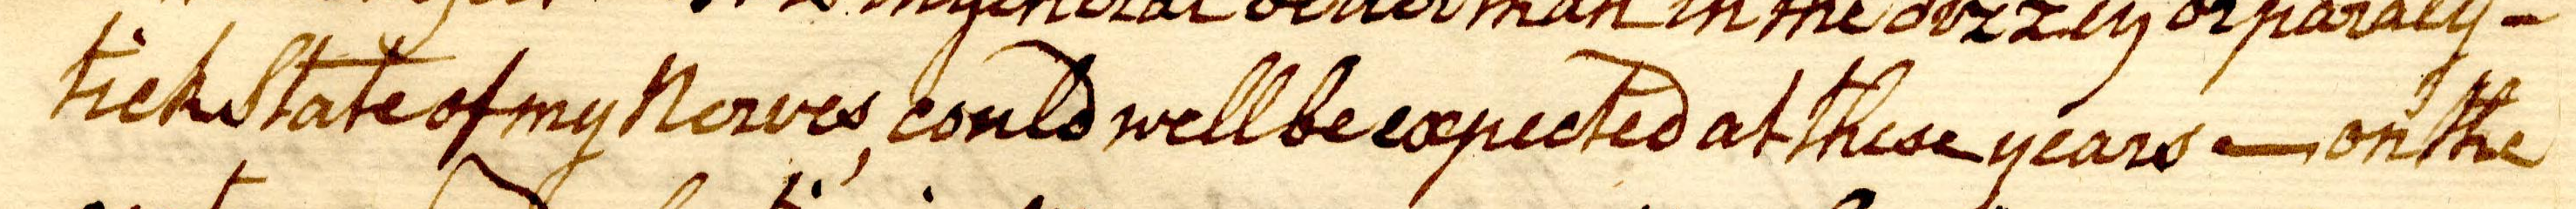tick state of my Nerves, could well be expected at these years- on the
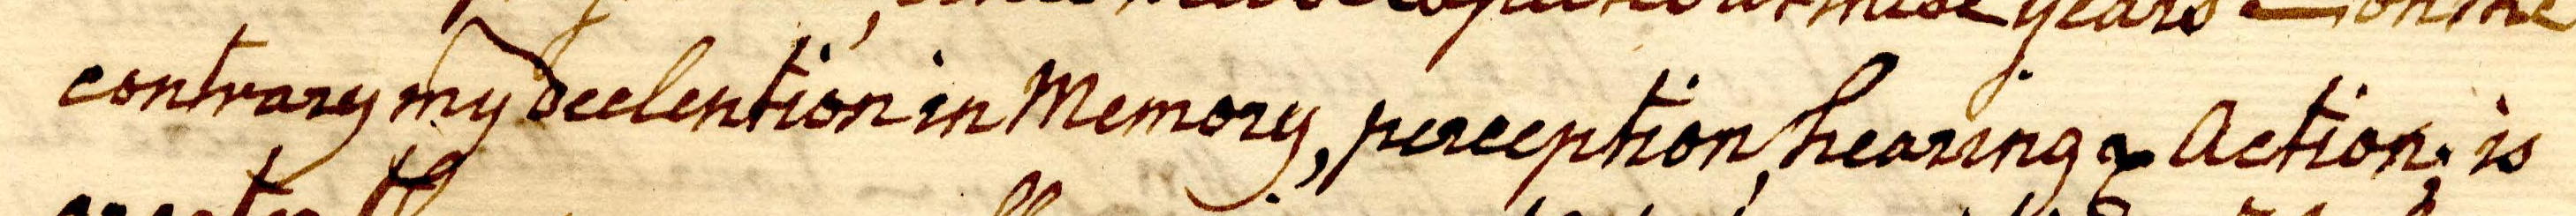contrary my declention in Memory, perception, hearing & Action; is
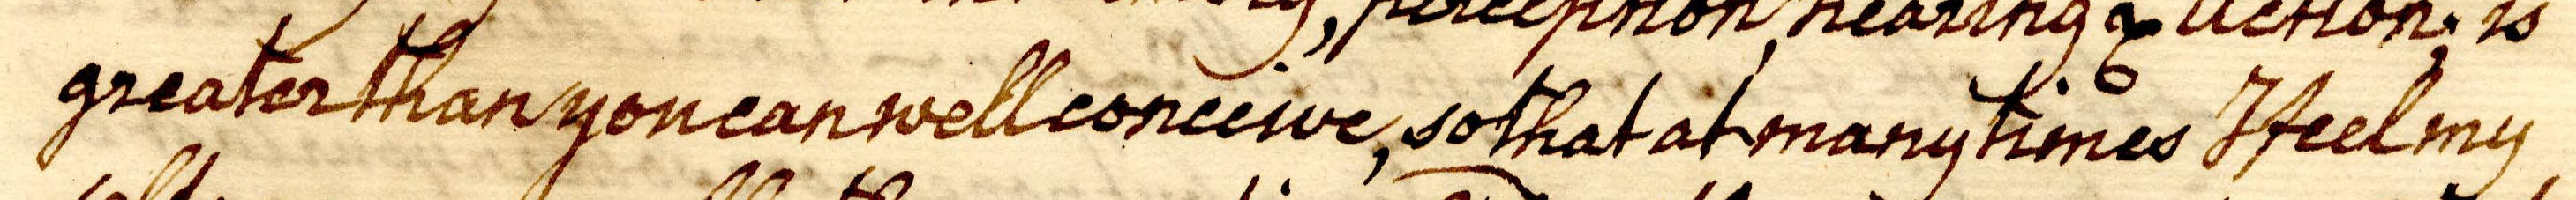greater than you can well conceive, so that at many times I feel my
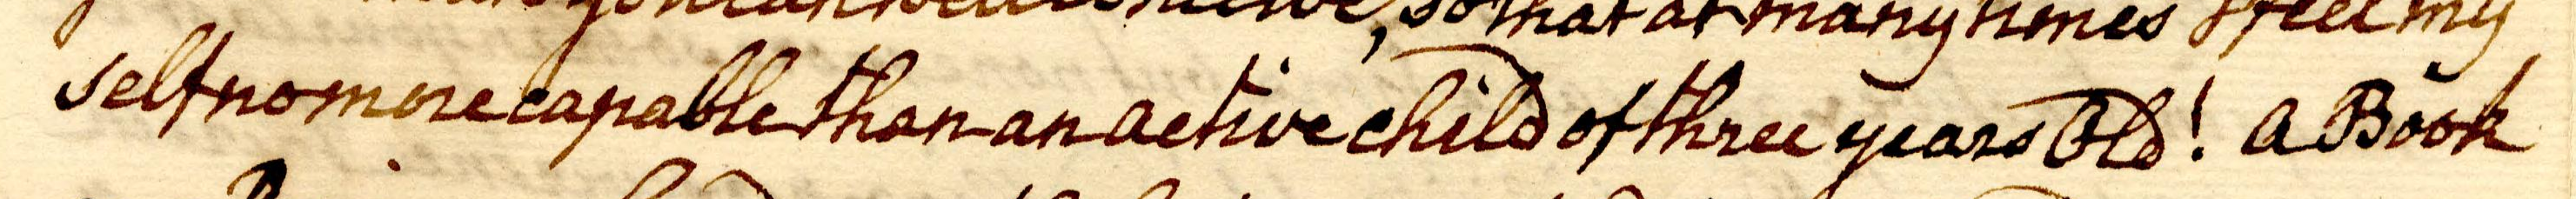self no more capable than an active child of three years Old! A Book
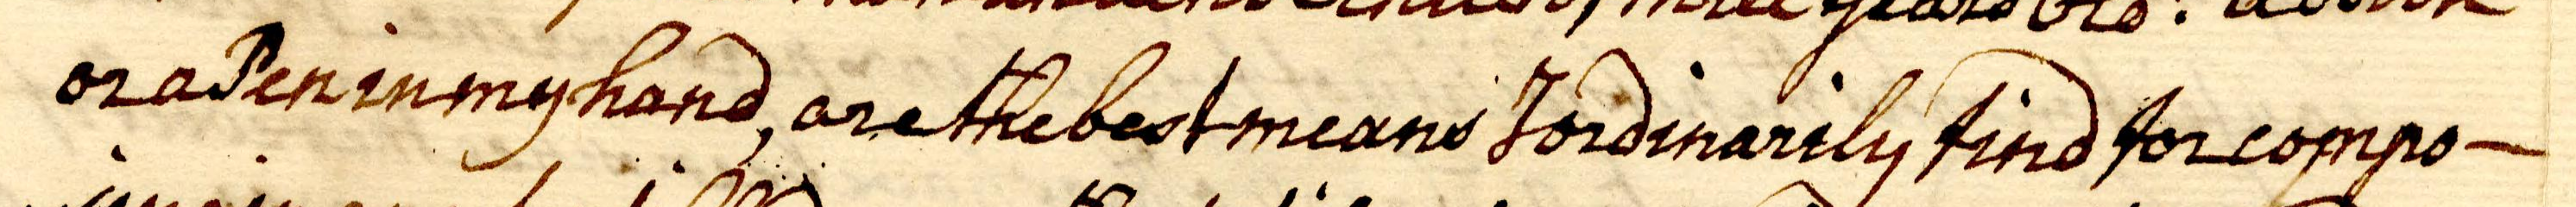or a Pen in my hand, are the best means I ordinarily find for compo-
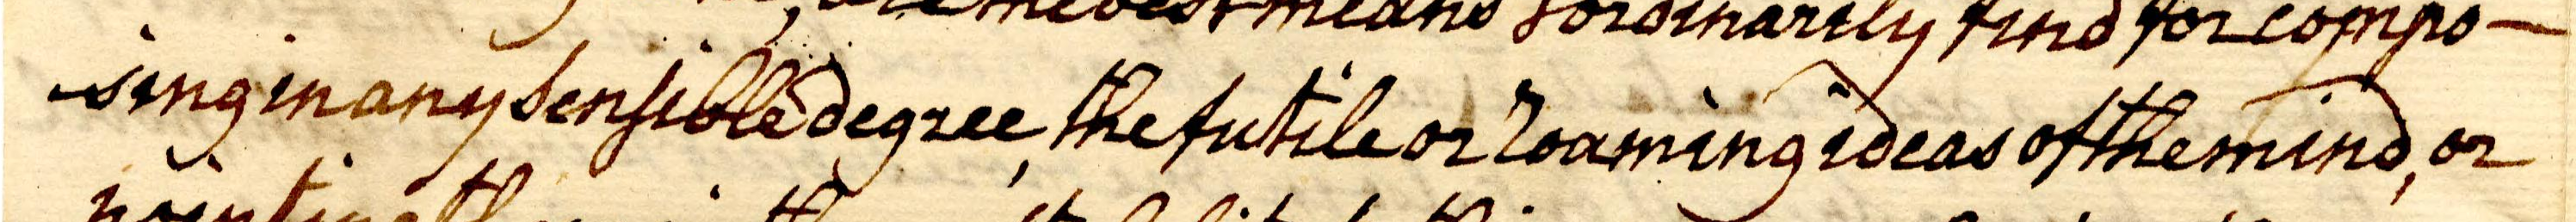-sing in any sensible degree, the futile or roaming ideas of the mind, or
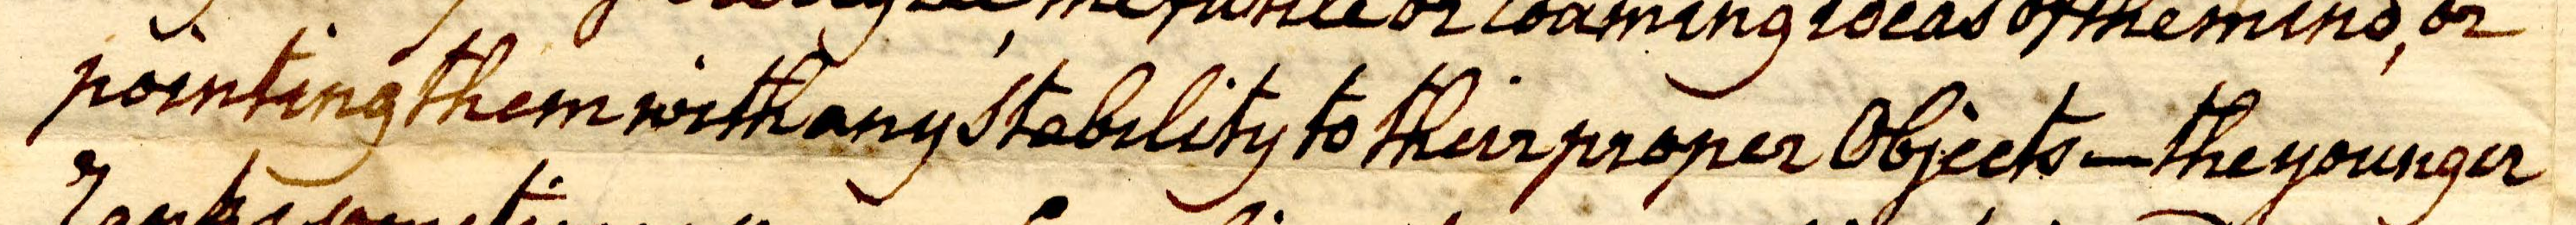pointing them with any stability to their proper Objects- the younger
